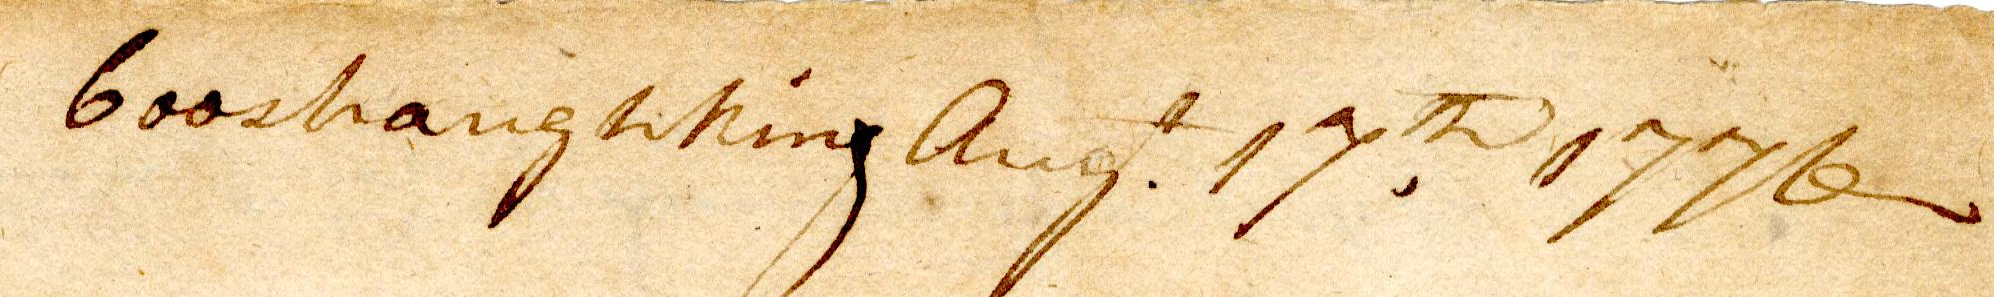Cooshaughking Aug^t. 17^th, 1776
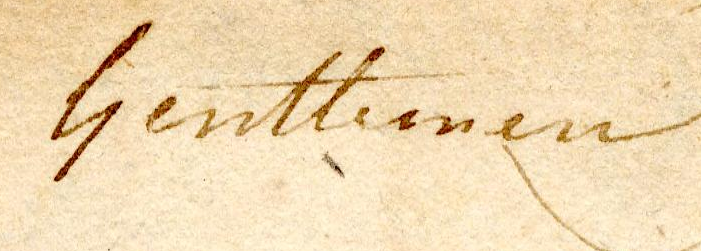Gentlemen
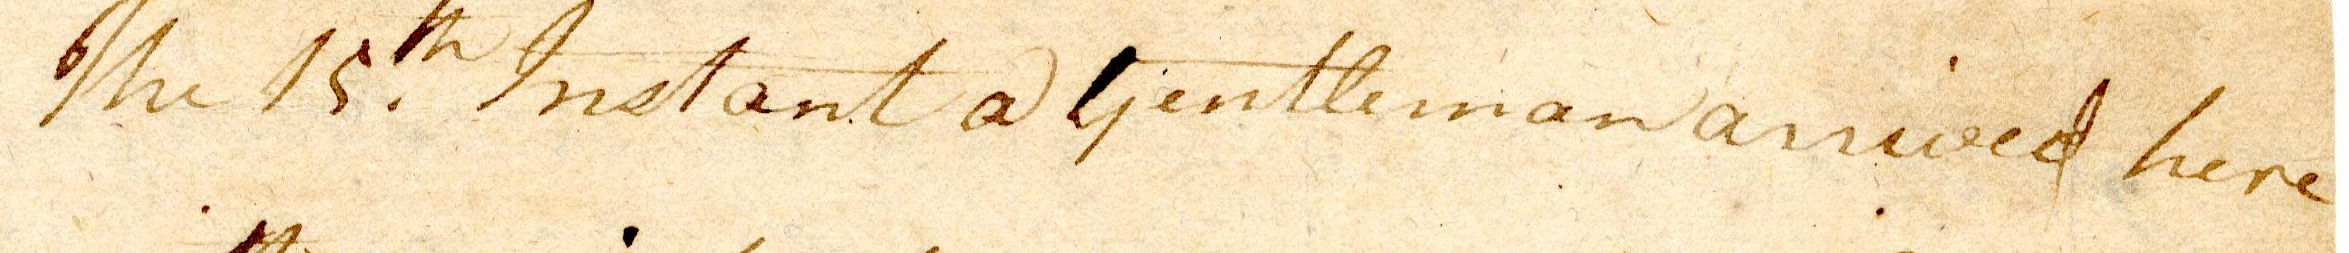The 15^th. Instant a Gentleman arrived here
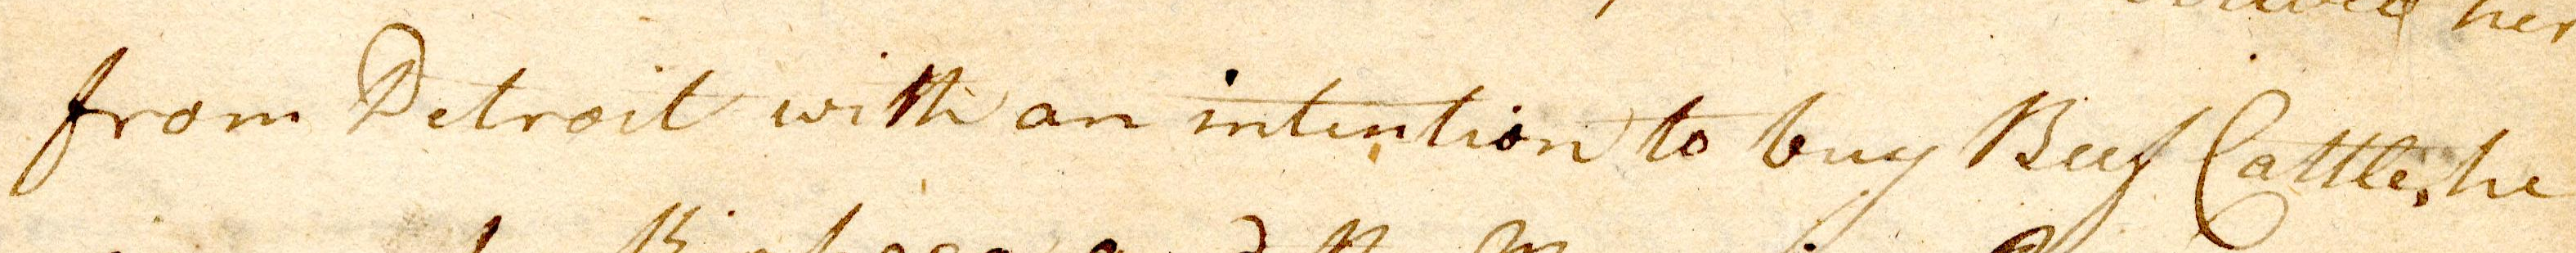from Detroit with an intention to buy Beef Cattle, he
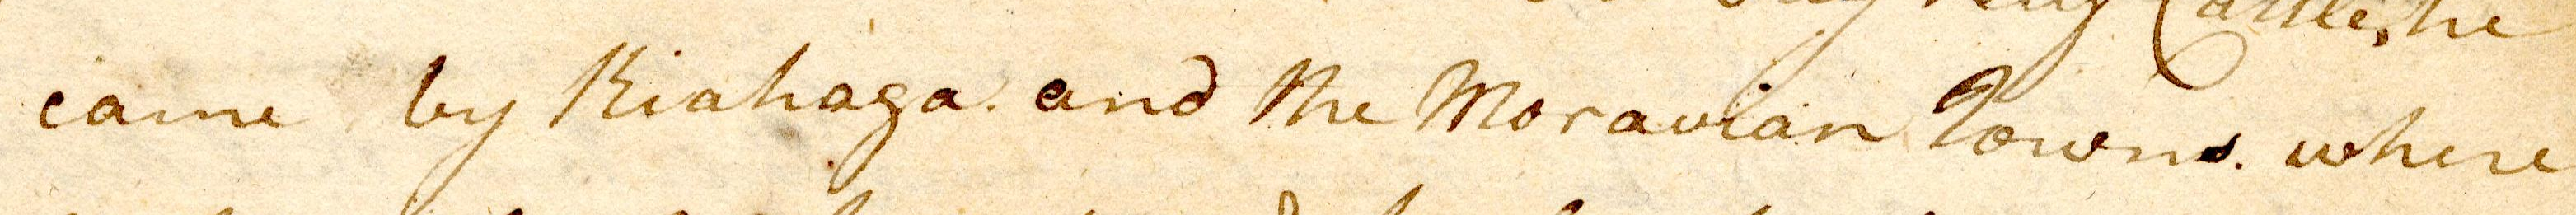came by Kiahaga and the Moravian Towns where
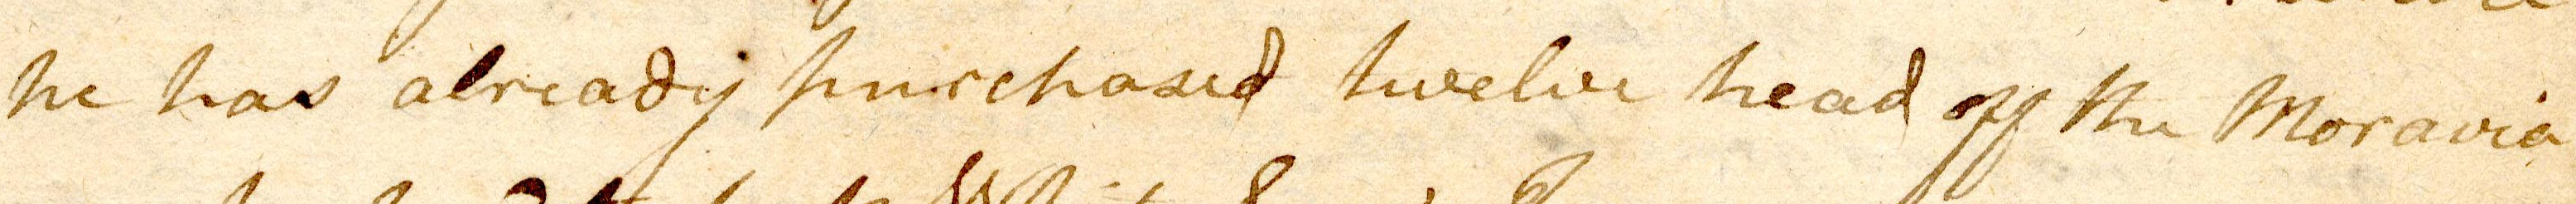he has already purchased twelve head off the Moravia
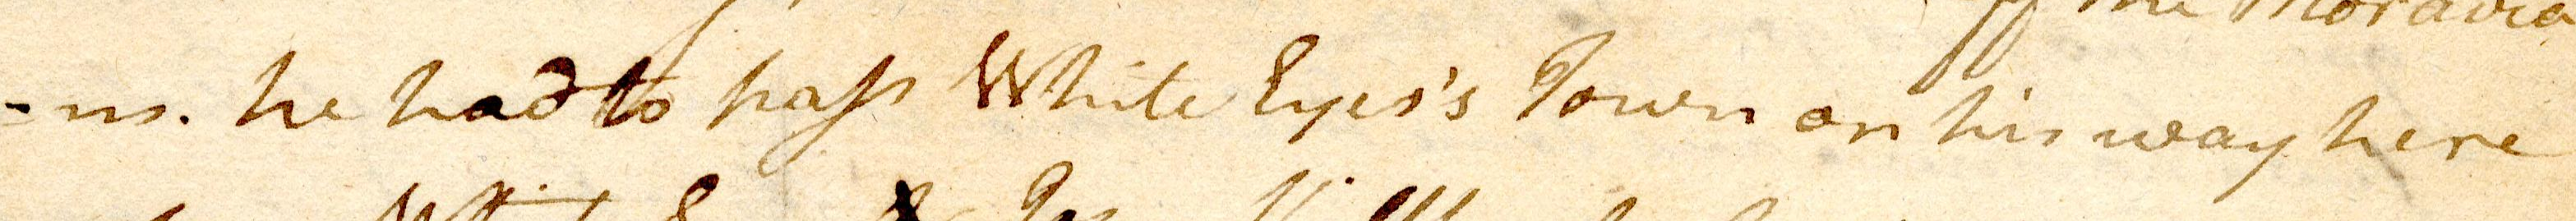-ns. he had to pass White Eyes's Town on his way here
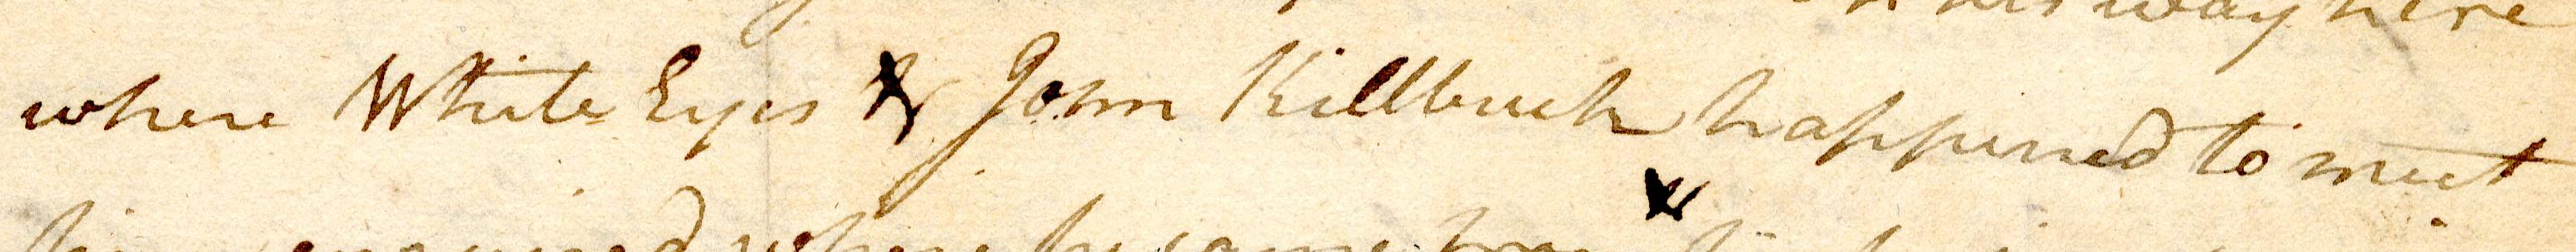where White Eyes & John Killbuck happened to meet
